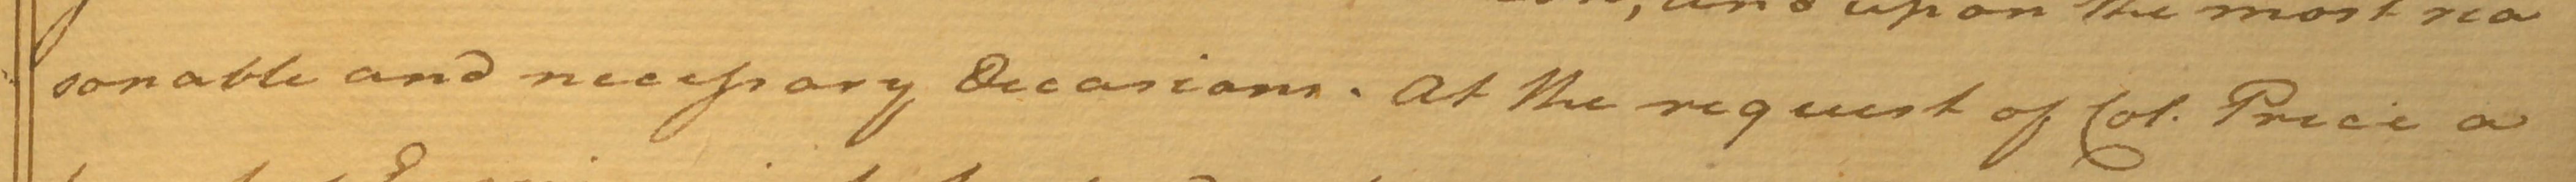sonable and necessary Occasions. At the request of Col. Price a
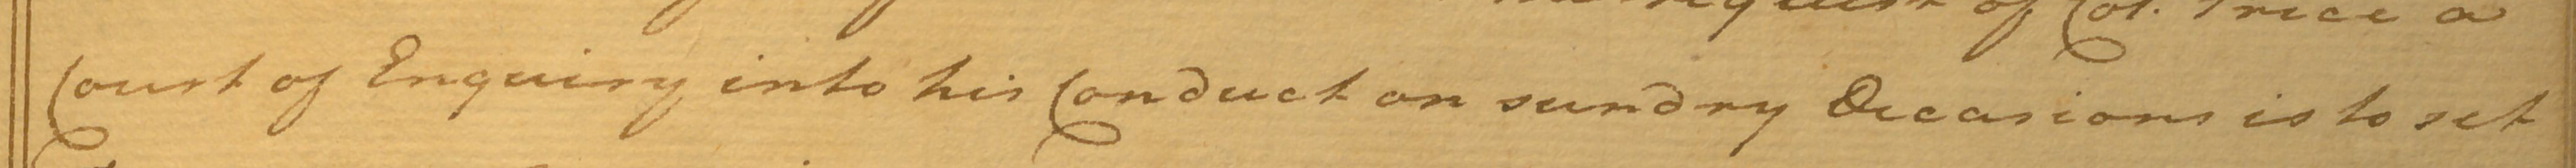Court of Enquiry into his Conduct on sundry Occasions is to set
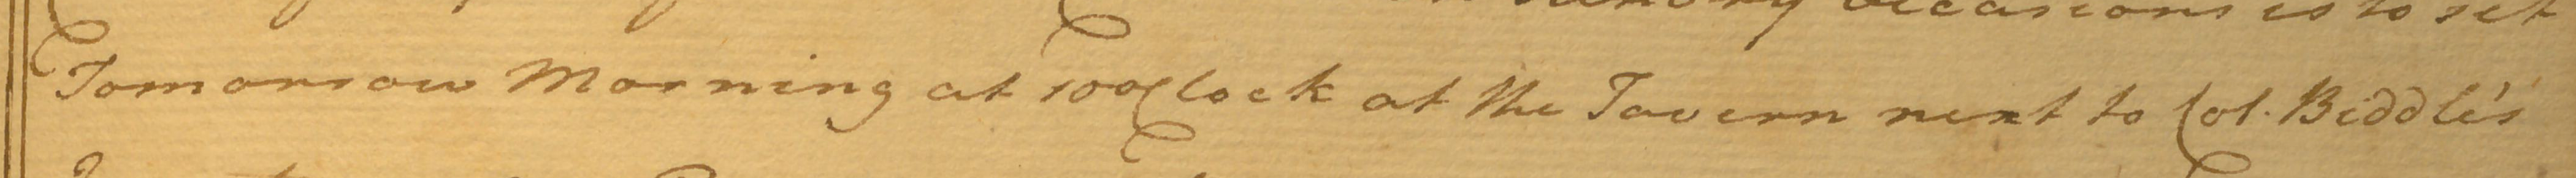Tomorrow Morning at 10 ^oClock at the Tavern next to Col. Biddle's
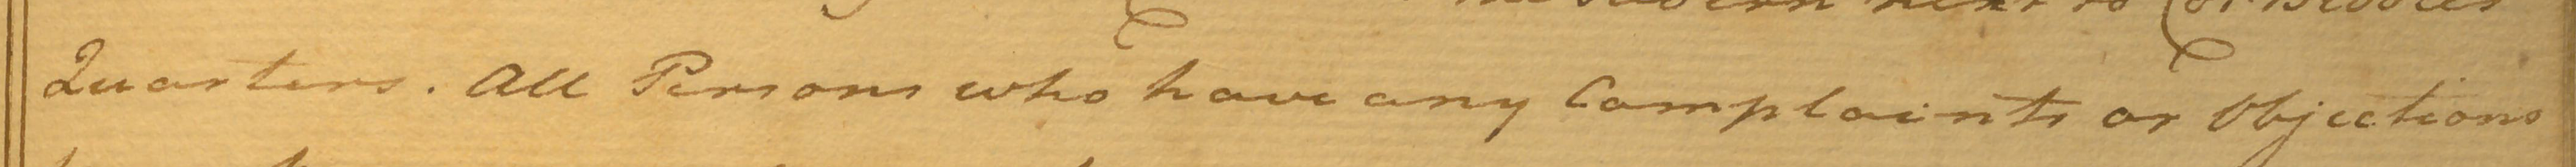Quarters. All Persons who have any complaints or Objections
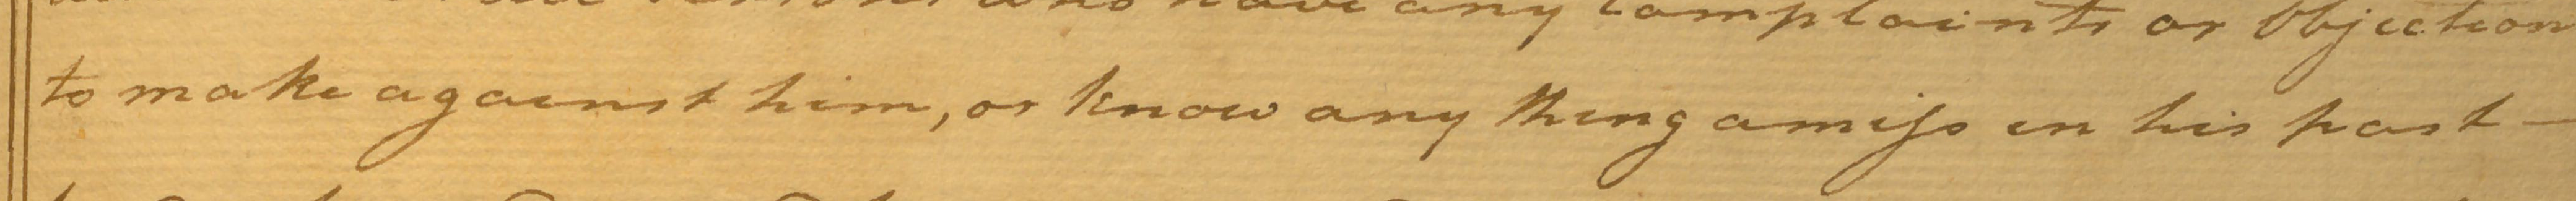to make against him, or know any thing amiss in his past
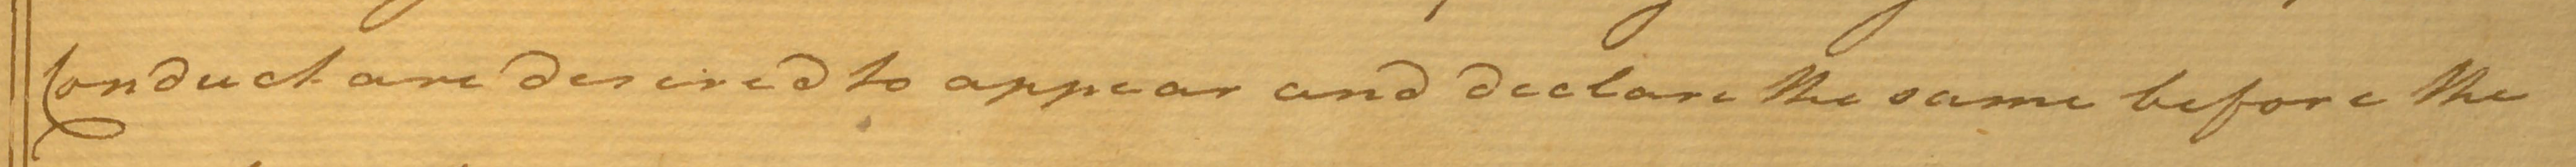Conduct are desired to appear and declare the same before the
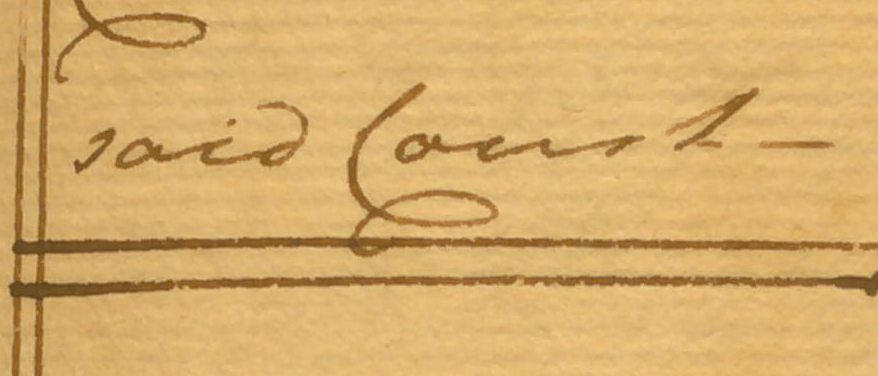said Court-
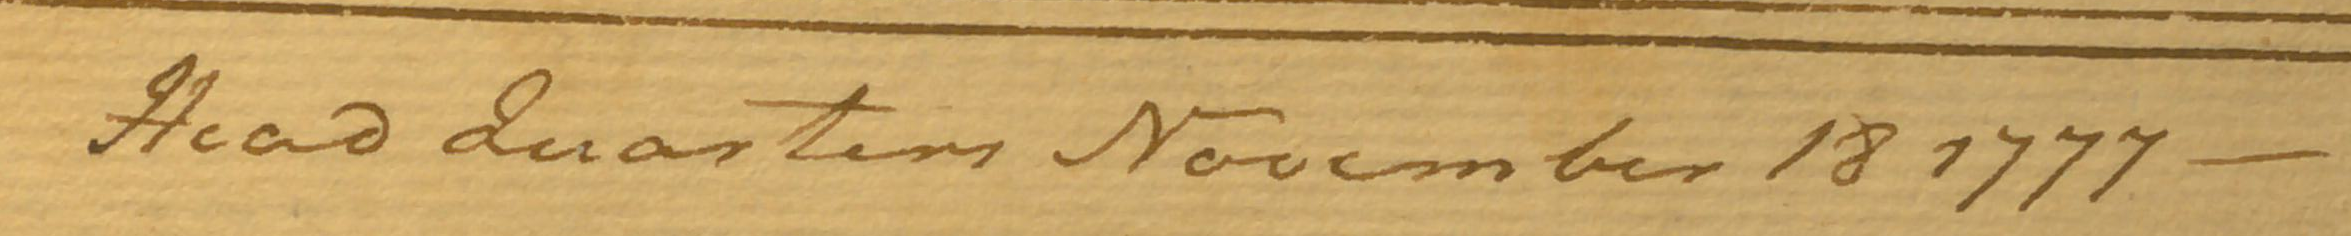Head Quarters November 18 1777-
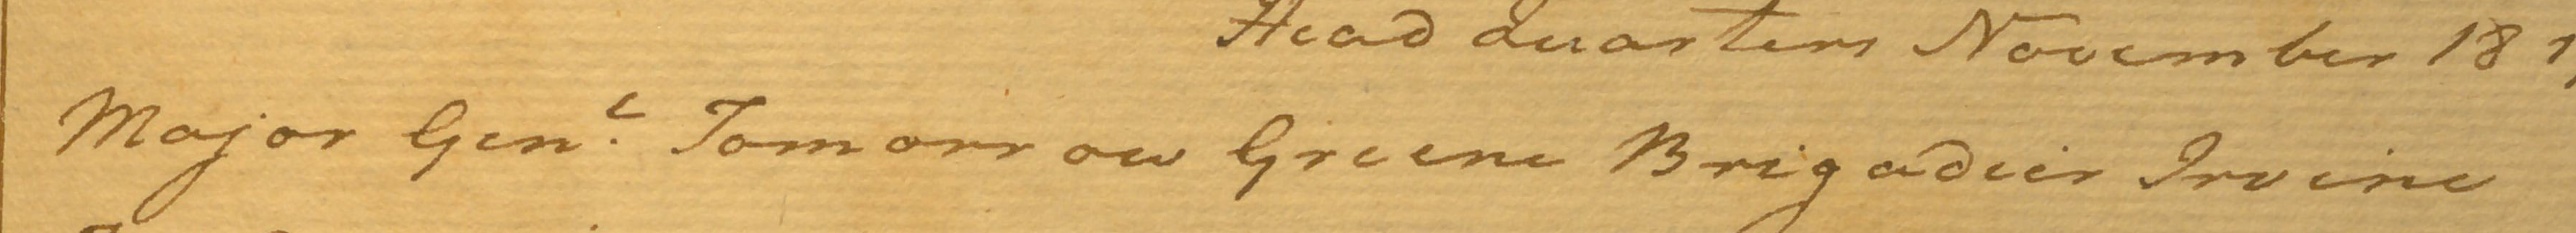Major Gen^l. Tomorrow Greene Brigadier Irvine
